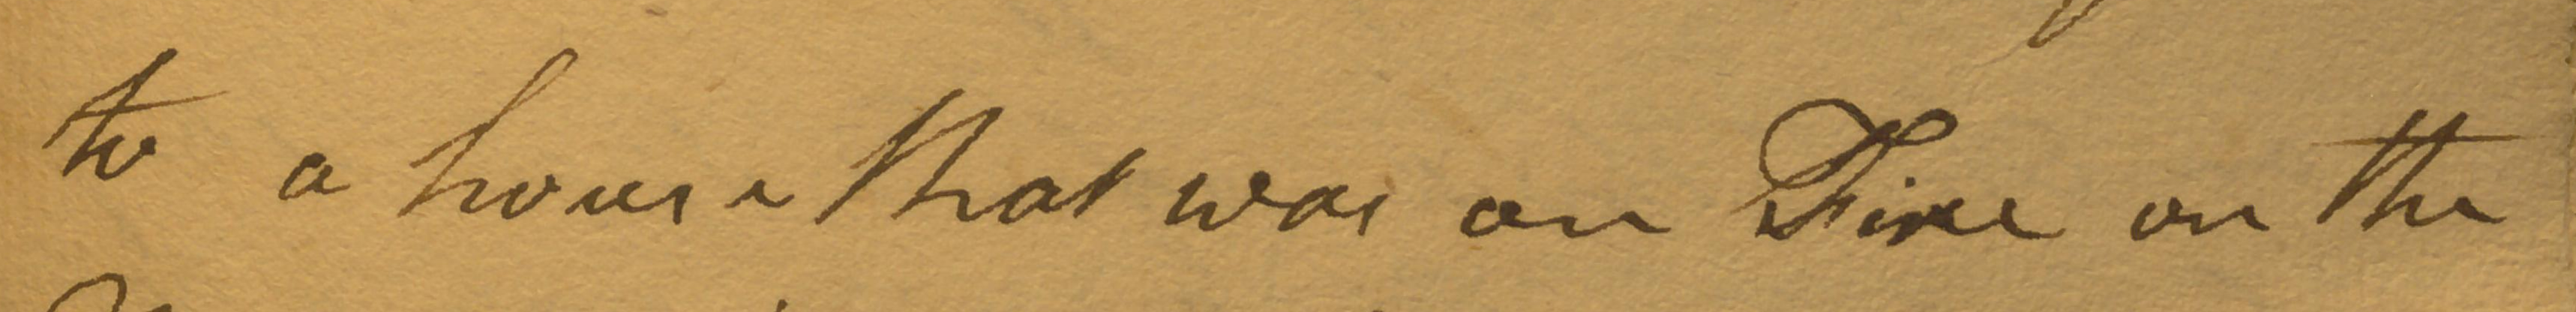to a house that was an Fire on the
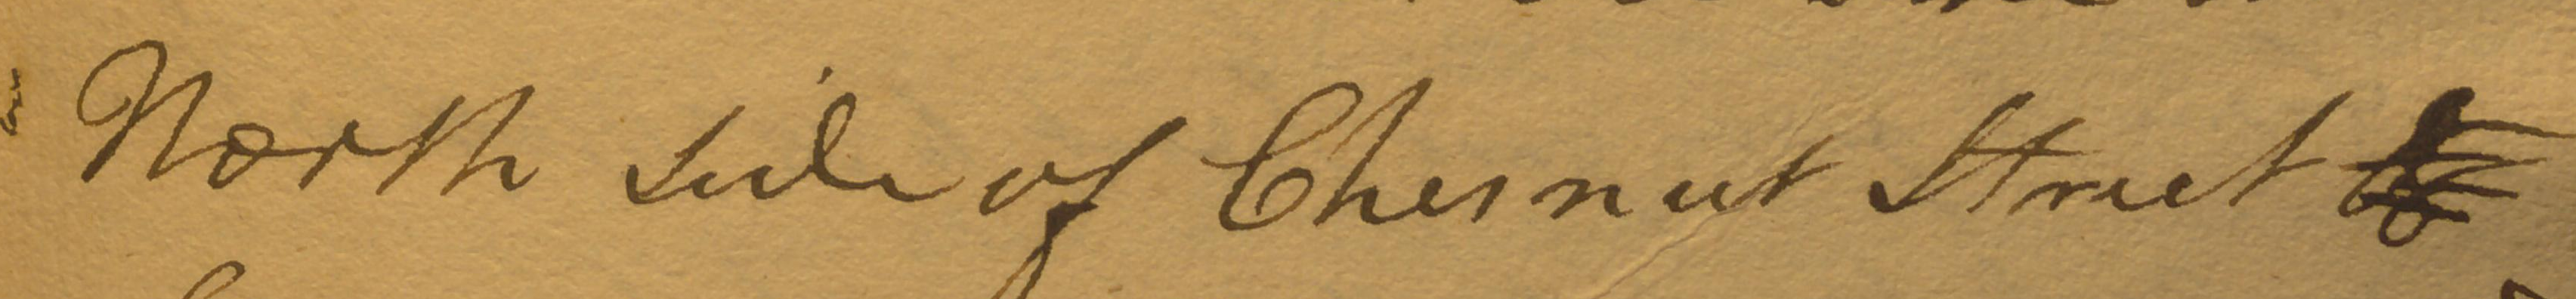North side of Chesnut Street [&]
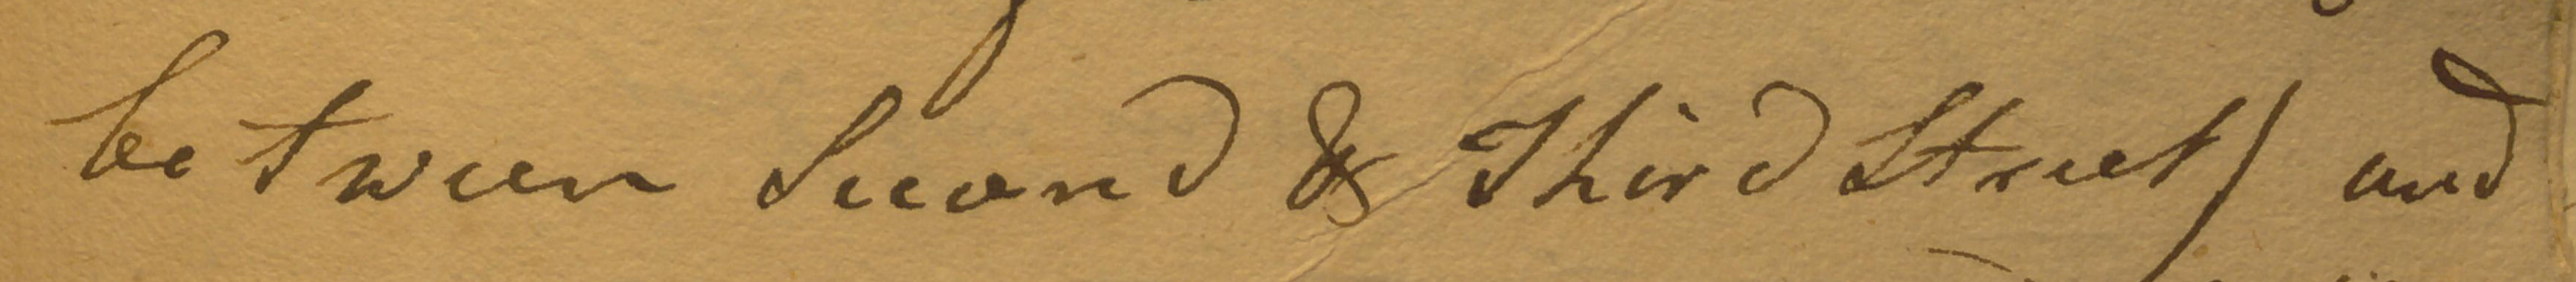between second & Third Street / and
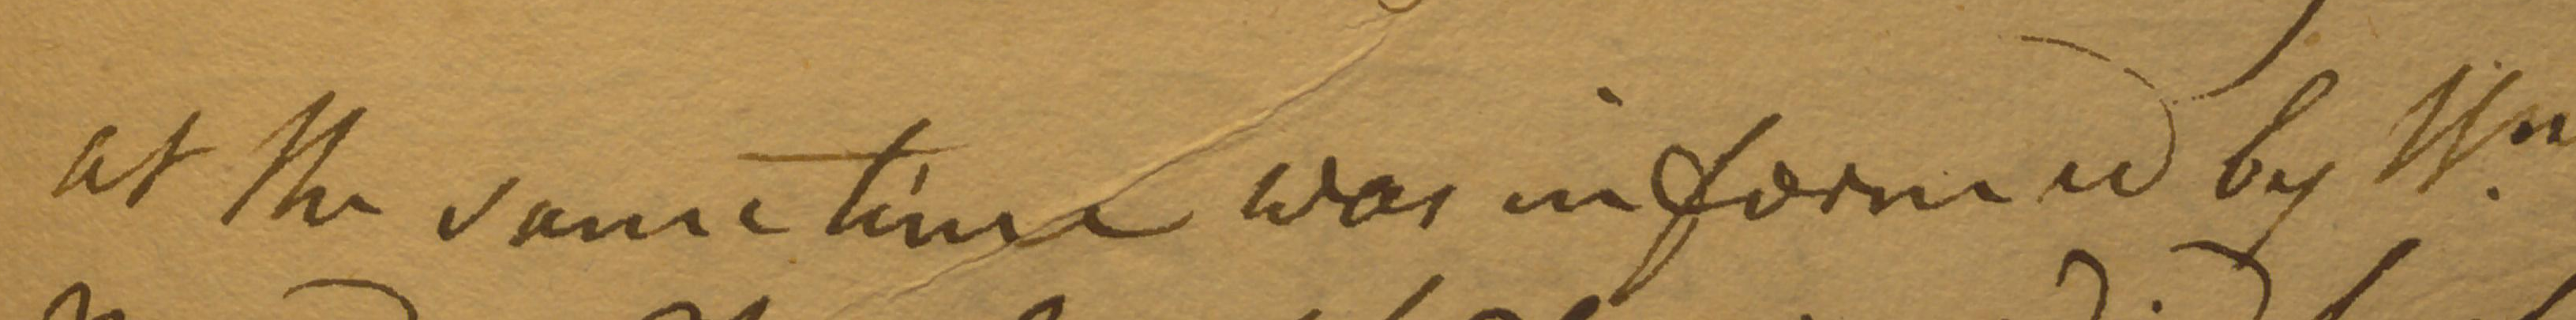at the same time was informed by W^m.
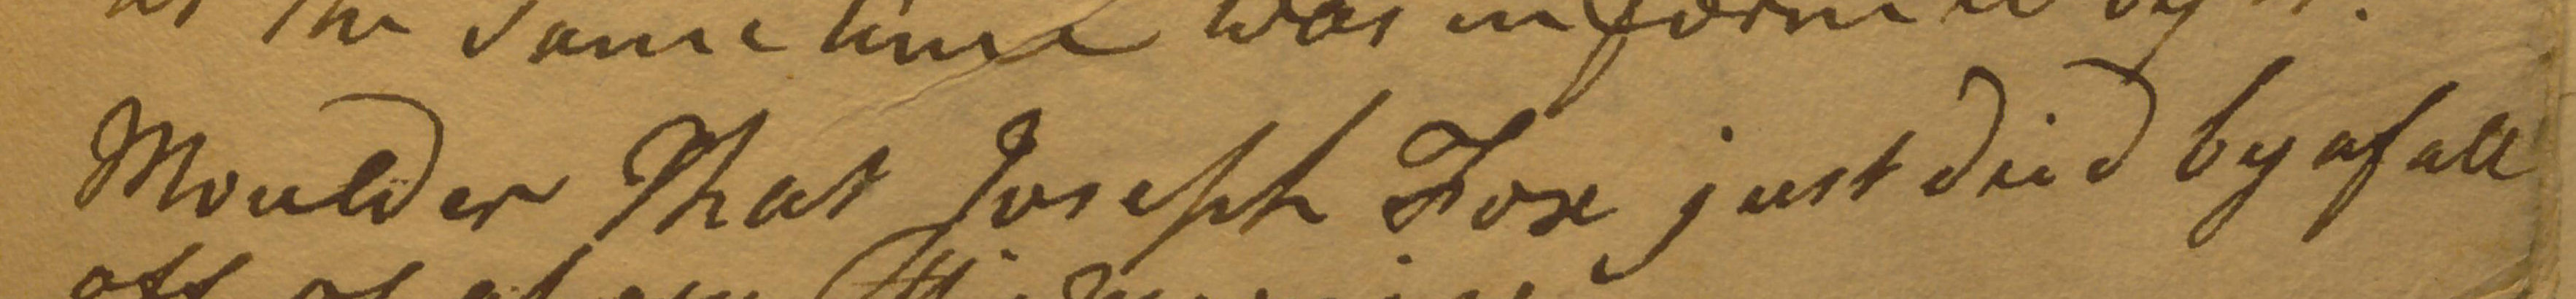Moulder That Joseph Fox just died by a fall
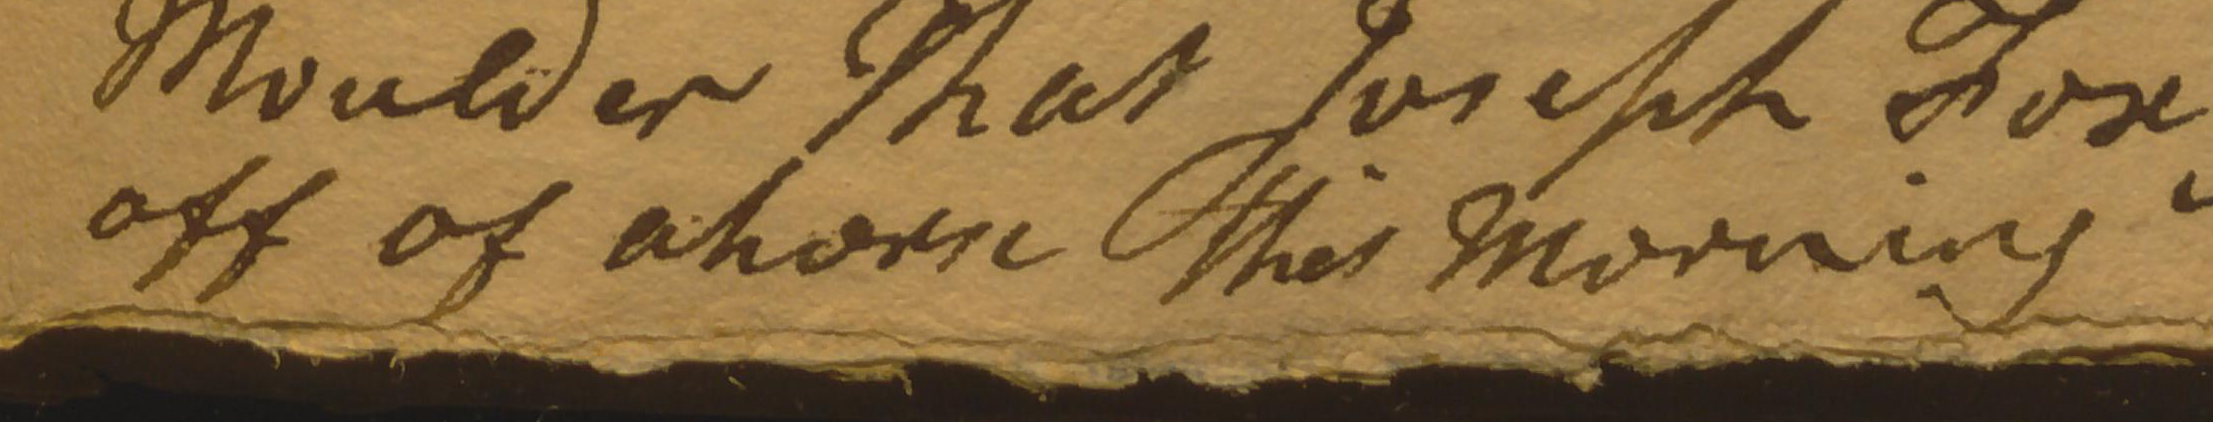off of a horse this morning
